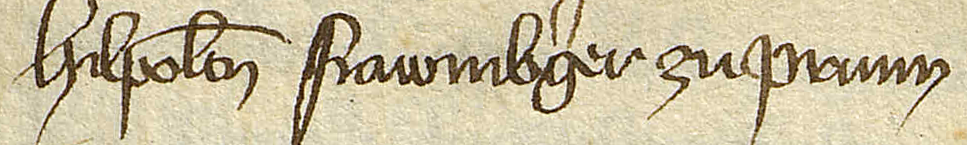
hilpoltn* Frawmb*ger cʒu Prunn
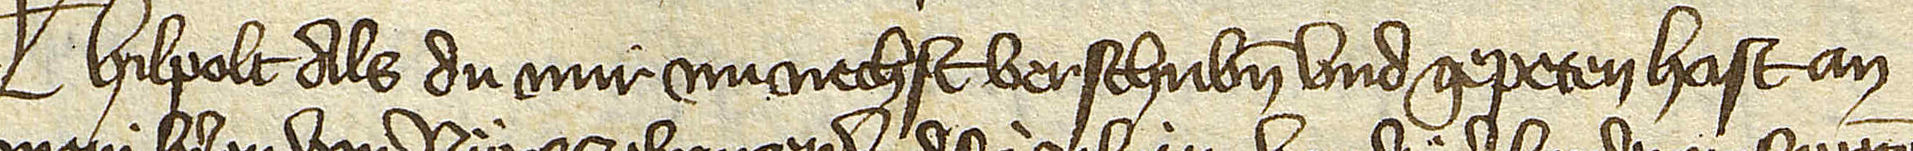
L* hilpolt Als du mir nu nechſt verſchribn* vnd gepeten haſt an
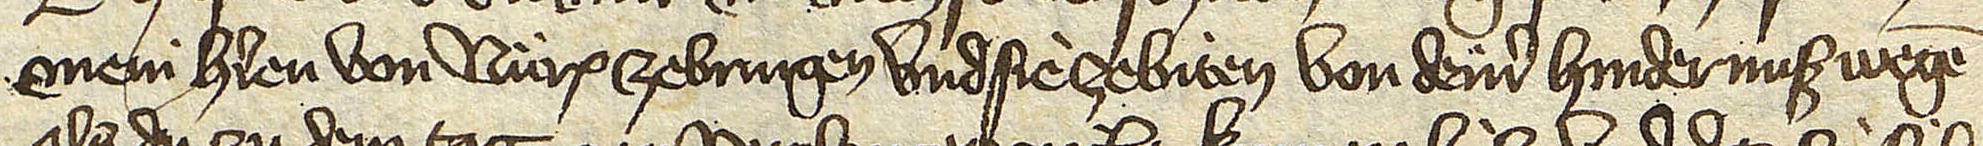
mein h*ren von Nür* cʒebringen vnd ſie cʒebiten von dem* hindernuſʒ wege*
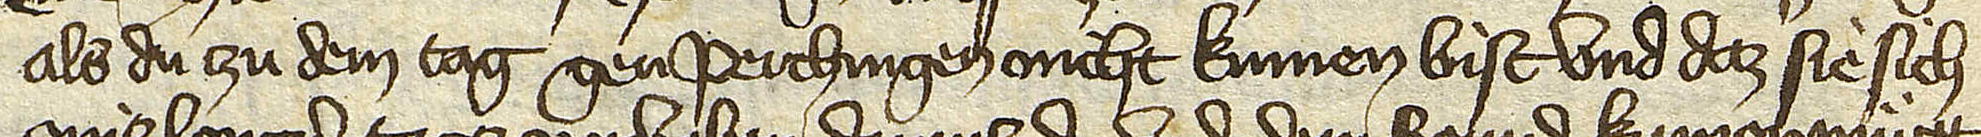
als du cʒu dem tag gen Perchingen nicht kumen biſt vnd daʒ ſie ſich
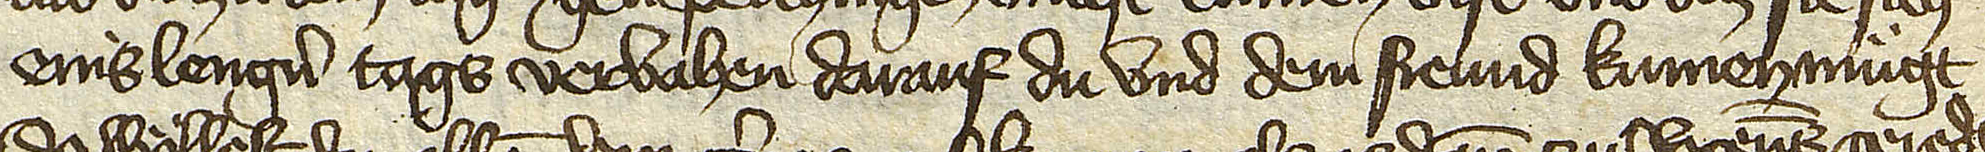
eind lengn* tags vervahen darauf du vnd dein freund kumen mügt
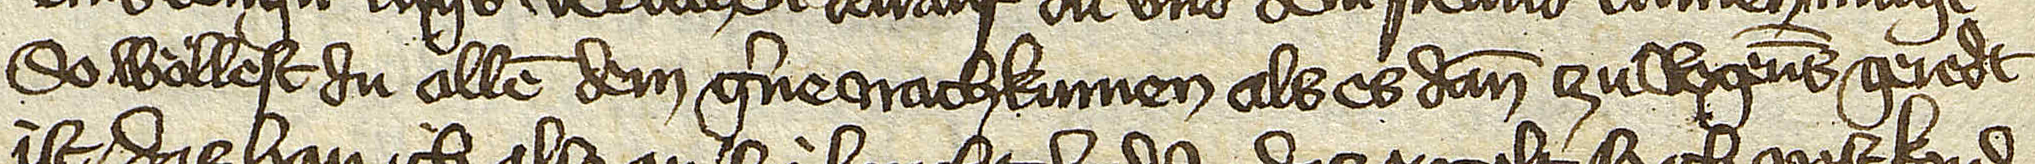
So wölleſt du alle* dem g*ne nachkumen als es dan* cʒu Regens* geredt
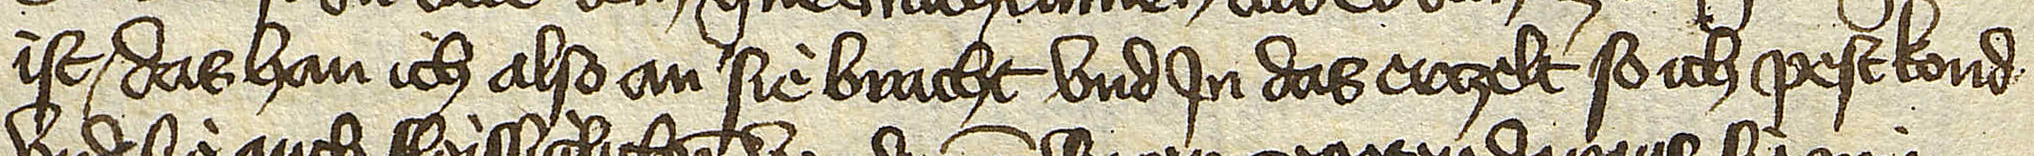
iſt / das hab ich alſo an ſie bracht vnd In das ercʒelt ſo ich peſt kond
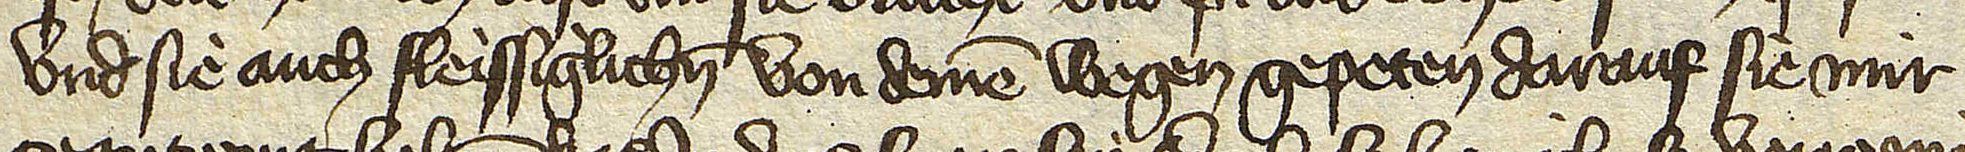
vnd ſie auch fleiſſiglichn* von deine* wegen gepeten darauf ſie mir
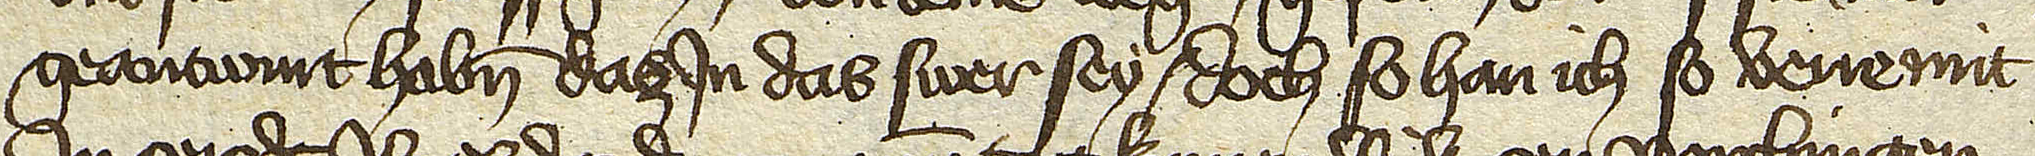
geantwurt habn* daʒ In das ſwer ſey / doch ſo han ich ſo verre mit
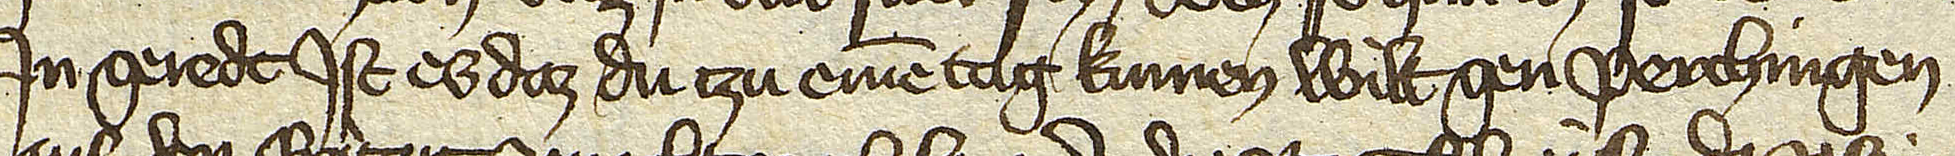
In geredt Iſt es daʒ du cʒu eine* tag kumen wilt gen Perchingen
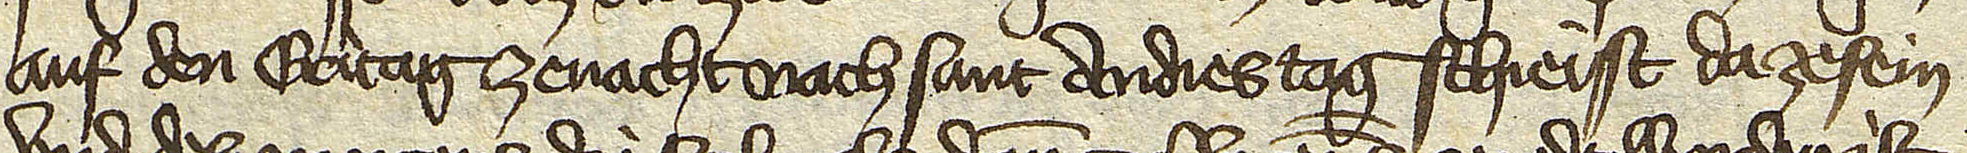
auf den Eritag cʒenacht nach ſant Andres tag ſchierſt da cʒeſein
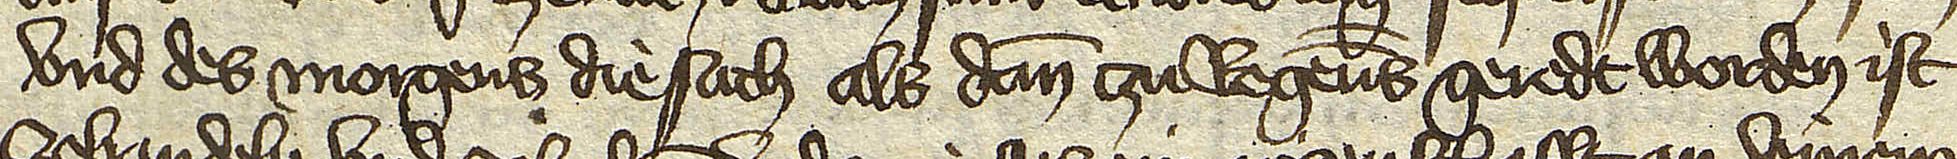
vnd des morgens die ſach als dan* cʒu Regens* geredt worden iſt
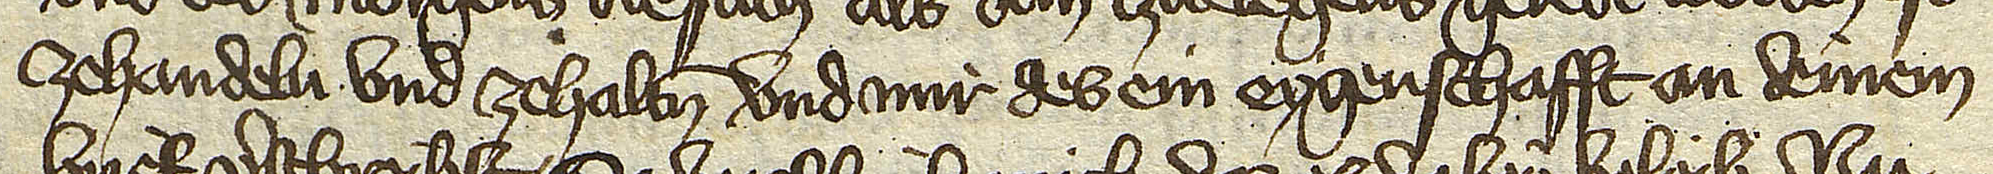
cʒehandeln vnd cʒehaltn* vnd mir des ein eygenſchafft an deinem
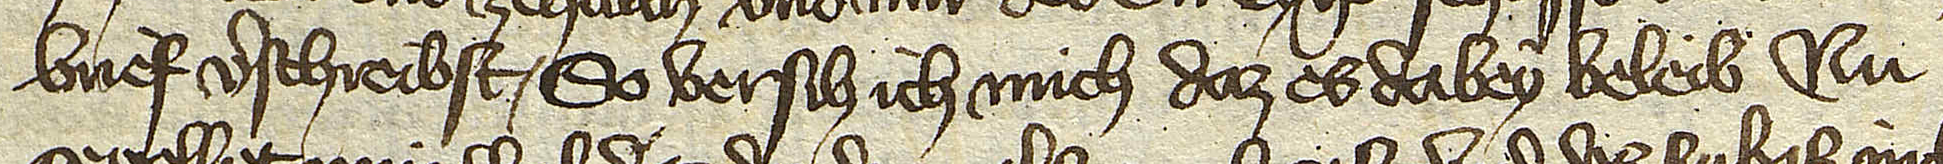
broef v*ſchreibſt / So verſih ich mich daʒ es dabey beleib Nu
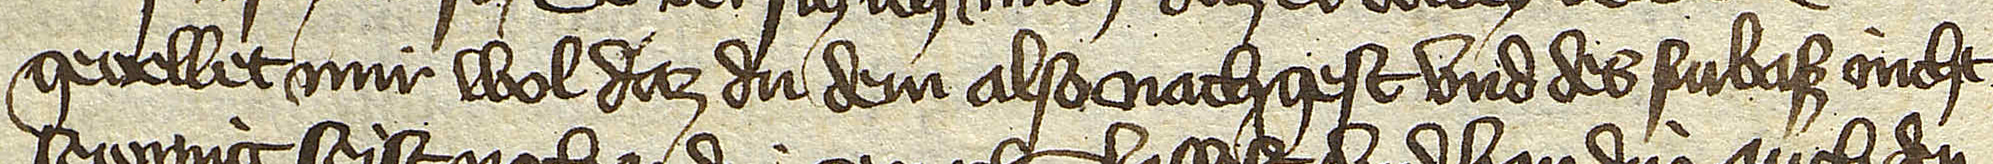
gevellet mir wol daʒ du dem alſo nach geſt vnd des furbaſʒ nicht
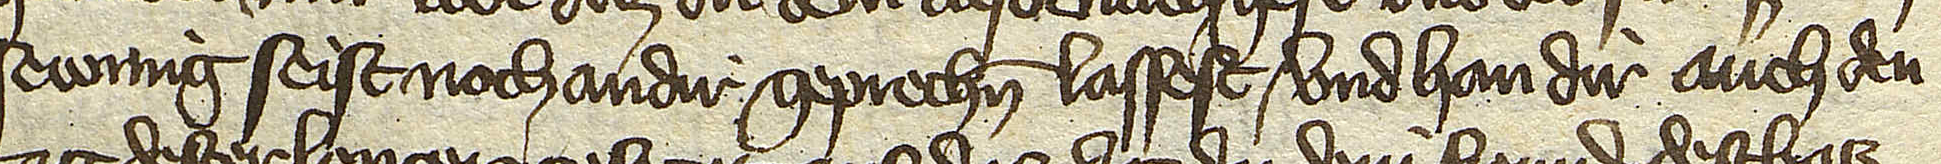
ſlewnig ſeiſt noch andir geprechn* laſſeſt / vnd han die auch den
